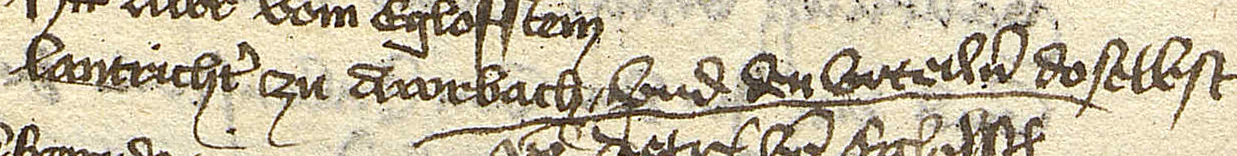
lantricht* cʒu Awrbach / vnd den vrteiln* doſelbſt
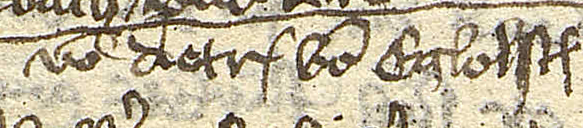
vo* dietr* vo* Eglolſt*
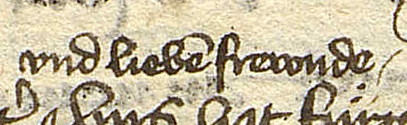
vnd liebe* frewnde /
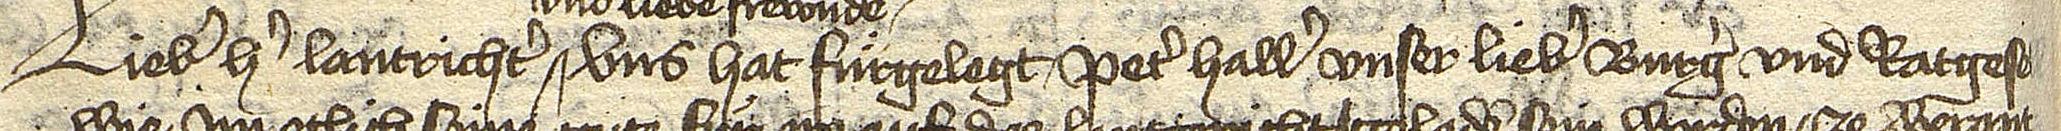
Lieb* h* lantricht* Vns hat fürgelegt / Pet* hall* vnſer lieb* Burg* vnd Ratgeſell
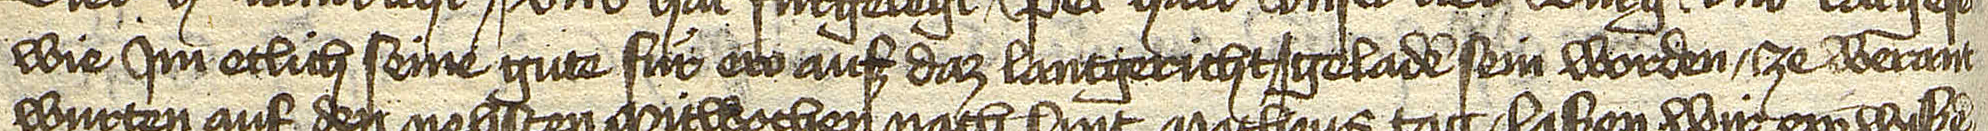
wie Im etlich ſeine gute für ew auf daʒ lantgericht gelade* ſein worden / cʒe verant
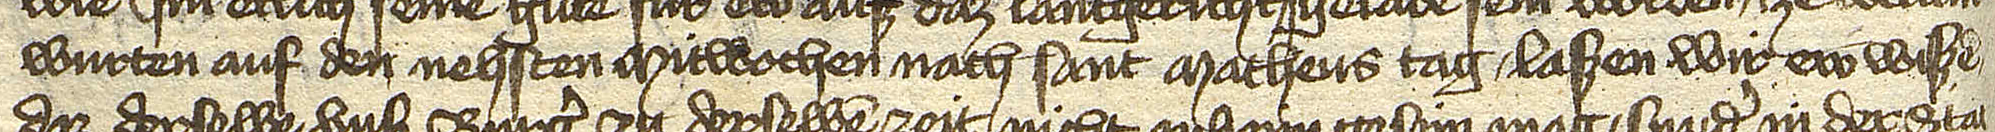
wurten auf den nehſten Mitwochen nach ſant Matheus tag / laſʒen wir ew wiſʒe*
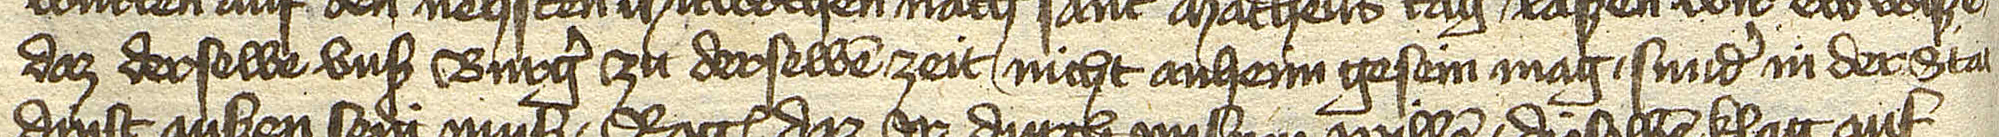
daʒ derſelbe vnſ* Burg* cʒu derſelbe* cʒeit nicht anheim geſein mag / ſund* in der Stat
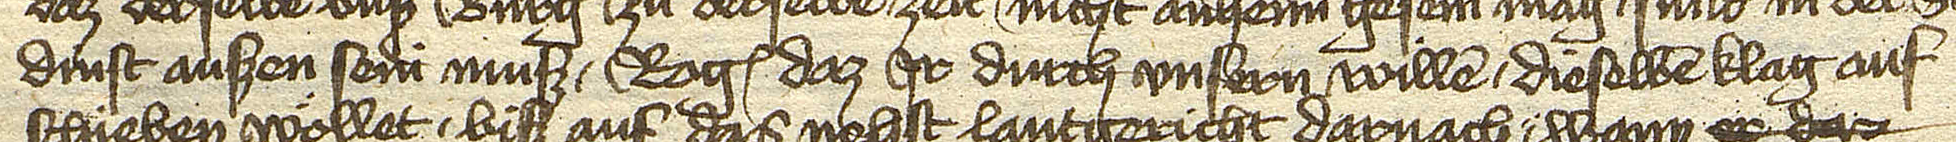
dinſt auſʒen ſein muſʒ / Rog* daʒ Ir durch vnſern wille* / dieſelbe* klag auf
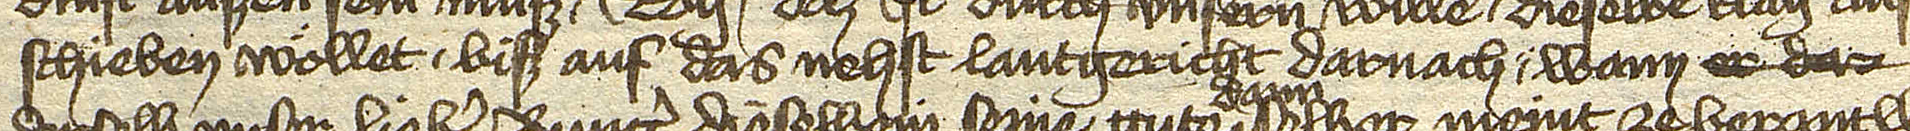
ſchieben wöllet / biſʒ auf das nehſt lantgericht darnach / wann er der
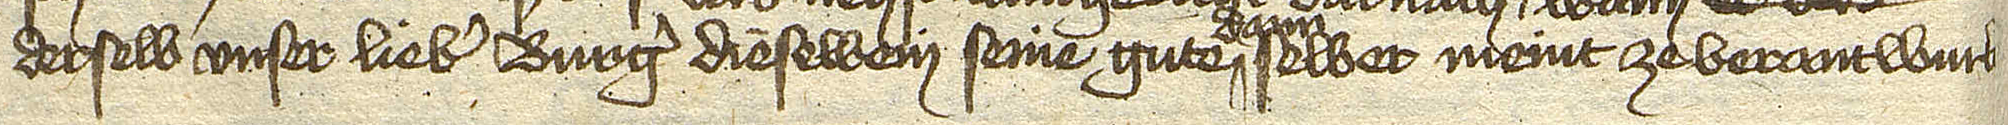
derſelb vnſer lieb* Burg* dieſelbein ſeine gute ſelber meint cʒe verantwurt*
